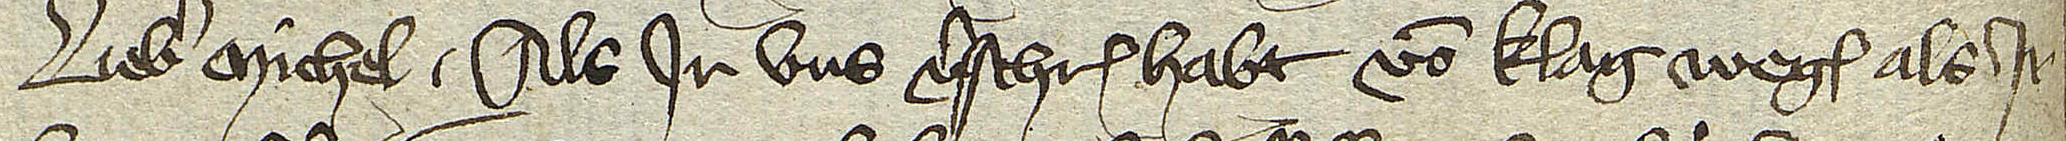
Lieb* Michel / Als Ir vns v*ſchr* habt vo* klag weg* als Ir
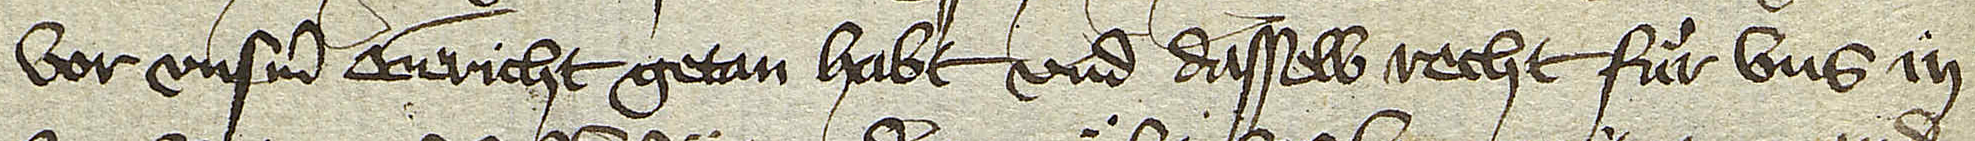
vor vnſm* Gericht getan habt vnd daſſelb recht für vns in
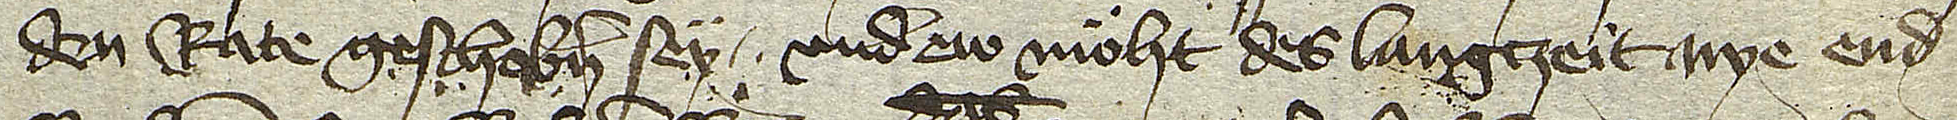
den Rate geſchobn* ſey / . vnd ew möht des langcʒeit nye end
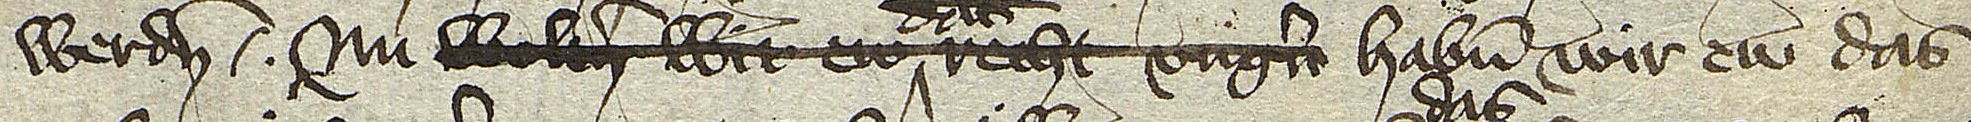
werdn* / . Nu woltn* wir ew recht vngn* habn* wir ew das
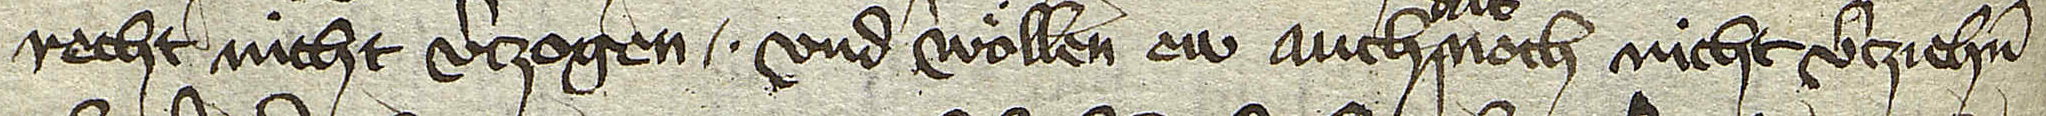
recht nicht v*cʒogen / . vnd wöllen ew auch noch nicht v*cʒiehn*
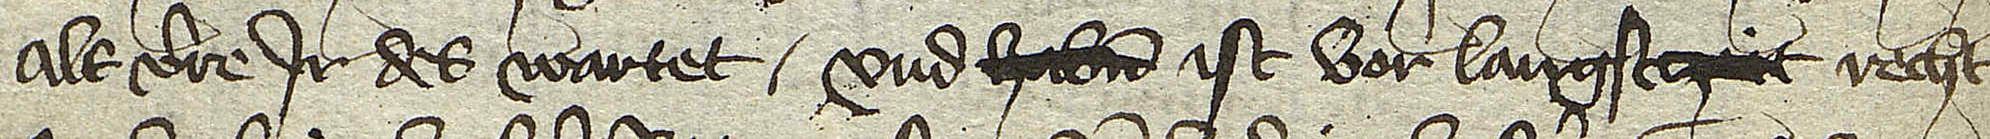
als v*re Ir des wartet / vnd habn* iſt vor langſtcʒeit recht
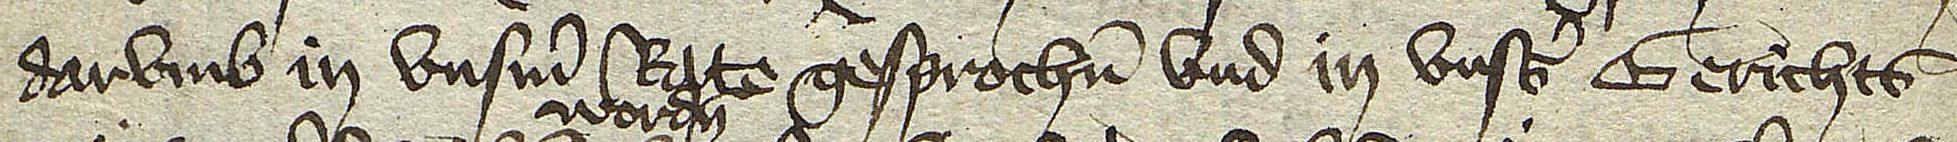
darvmb in vnſm* Rate geſprochn* vnd in vnſs* Gerichts
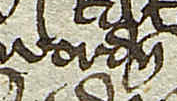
wordn*
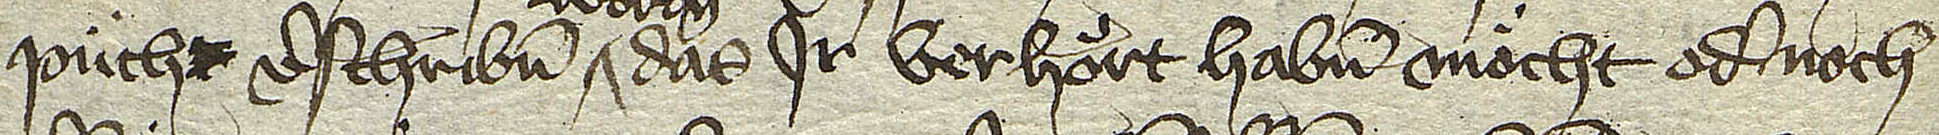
püchr v*ſchribn* / das Ir verhört habn* möcht od* noch
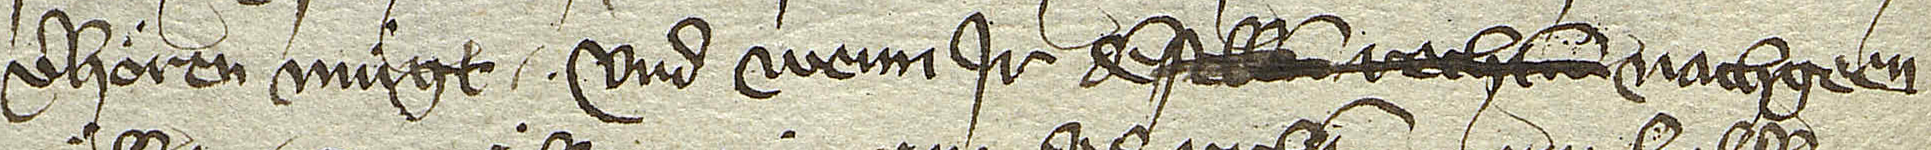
v*hören mügt / . vnd wenn Ir de*ſelbn* rechtn* nachgeen
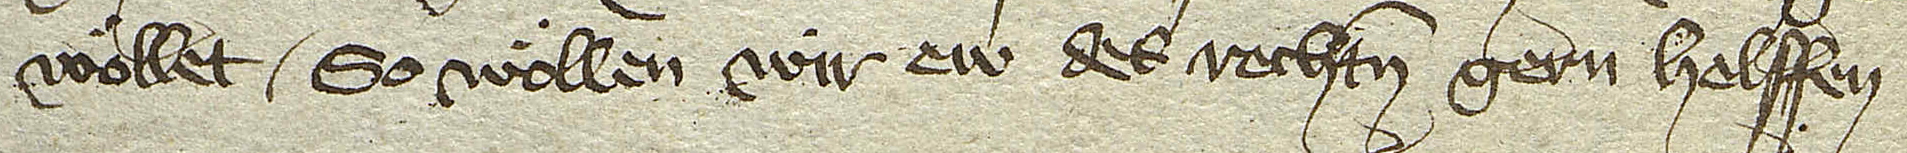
wöllet / So wöllen wir ew des rechtn* gern helffen
